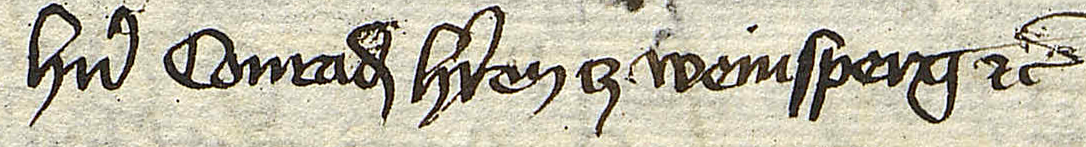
h*n Conrad h*ren cʒ weinſperg ec*
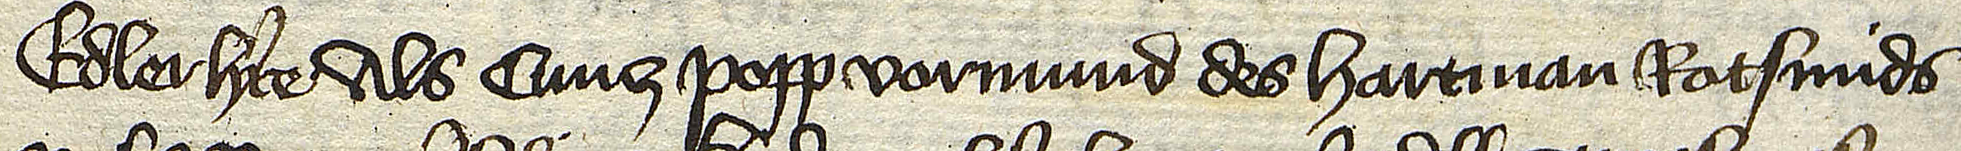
Edler h*re Als Cuncʒ popp vormund des hartman Rotſmids
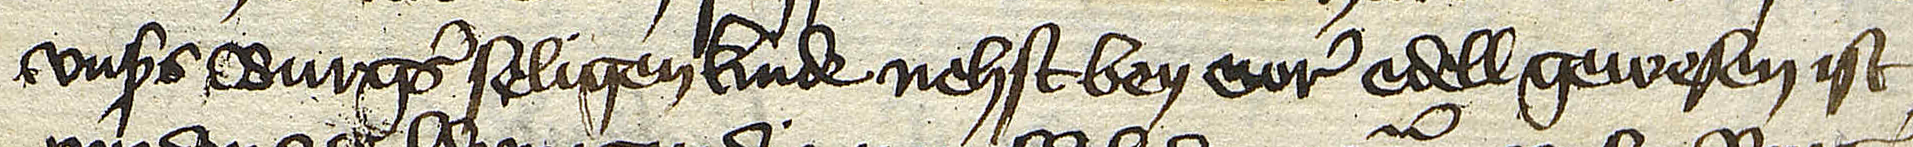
vnſ*s Burg*s ſeligen kinde nehſt bey ewr* edell geweſen iſt
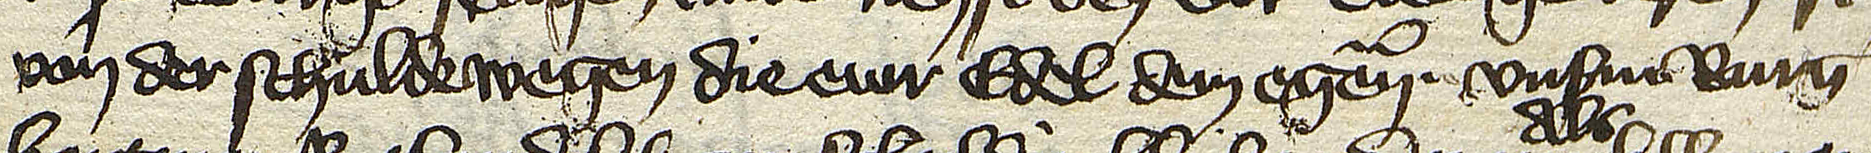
von der ſchulde wegen die ewr Edel dem egen* vnſ*m Burg*
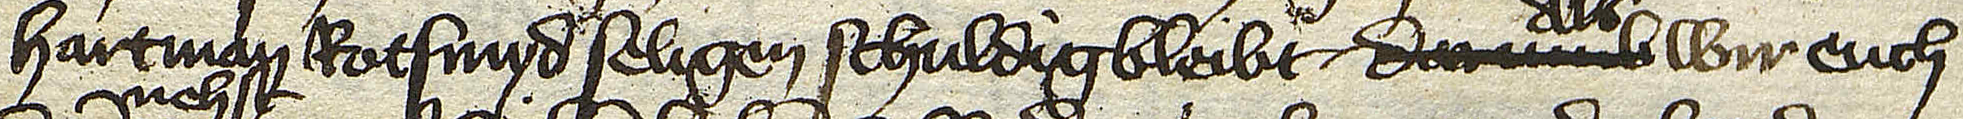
hartman Rotſmyd ſeligen ſchuldig bleibt / Darumb wir euch
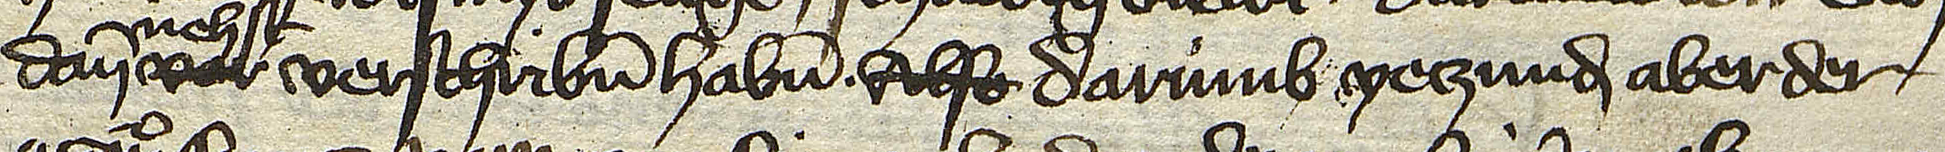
dan* vor verſchrib*n hab*n . Alſo darümb yecʒund* aber der
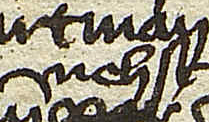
nehſt
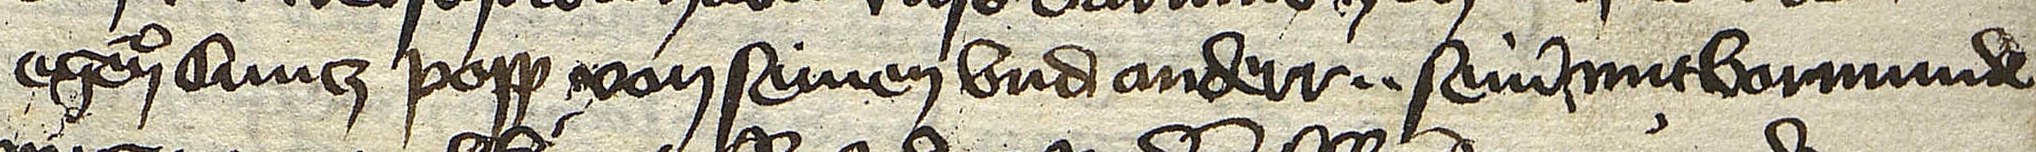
egen* Cuncʒ popp von ſeinen vnd anderr ~ ſein* mitvormunde
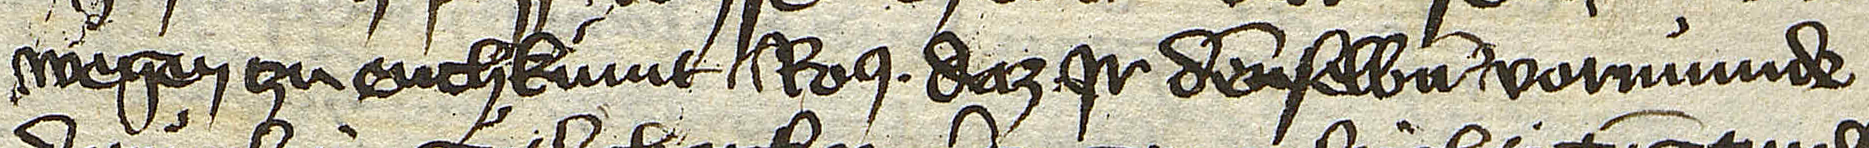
wegen cʒu euch kümt / Ro* . daʒ Ir denſelbn* vormünde
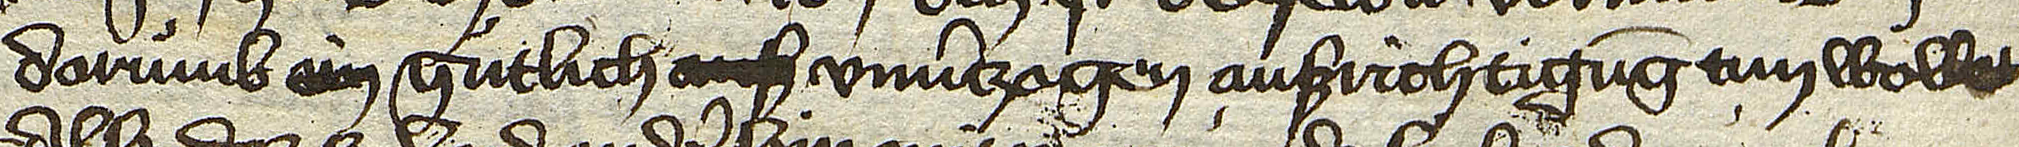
darümb ein gütlich auſʒ vnu*cʒogen auſʒrichtigu*g tun wöllet
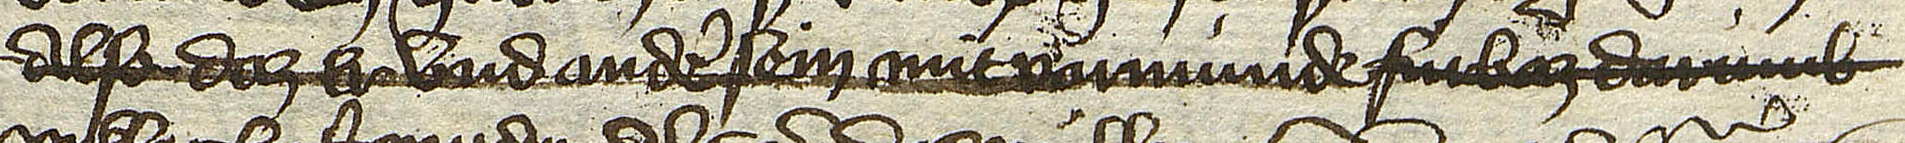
Alſo daʒ Er kind ande* ſein mitvormünde fürbaʒ darümb
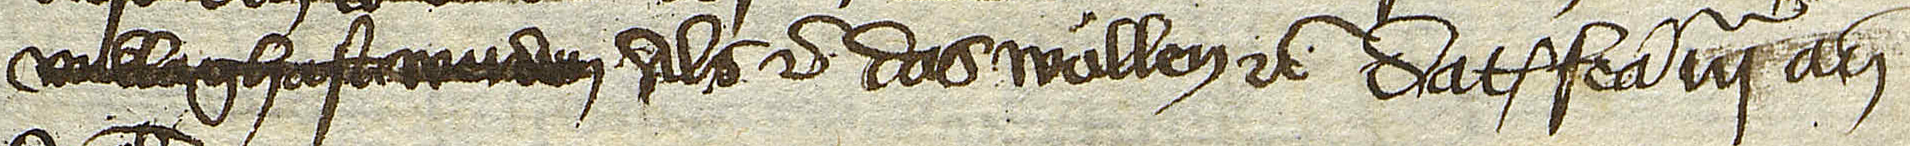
vnklaghaſt werden Als ec* . das wöllen ec* Dat* f*ia iii* an*
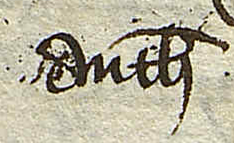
Anth*
